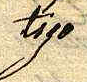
tigo
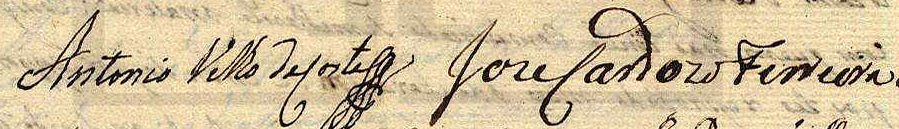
Antonio Velho de Costa Joze Cardozo Ferreira
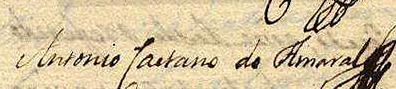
Antonio Caetano do Amaral
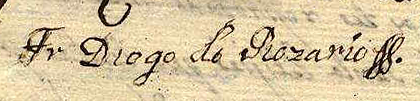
Fr. Diogo do Rozario
